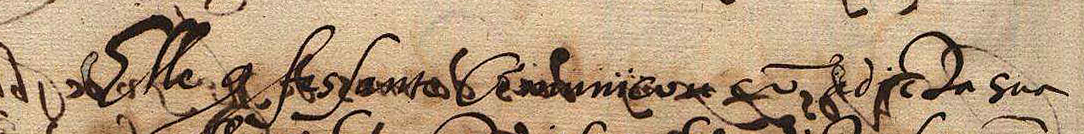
Elle ꝯfessante Comunicou cō a dicta sua
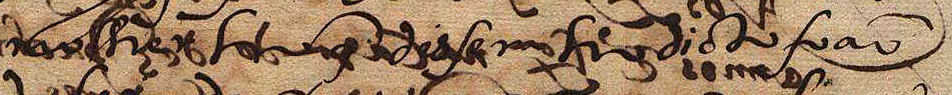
molher ho q̄ dissera ho dicto foaõ
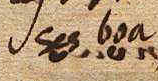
ses boa
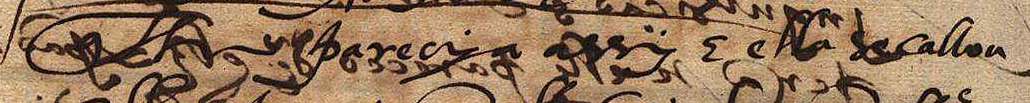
q̄ lhe parecya assy E ella se callou
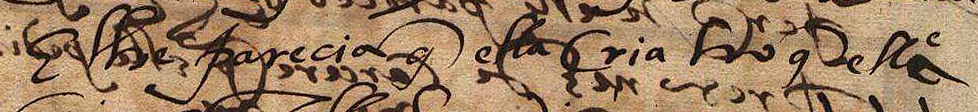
E lhe parecia q̄ ella Cria ho q̄ ella
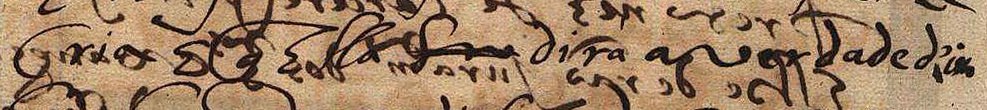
Cria E q̄ Ella ho dira a verdade dice?
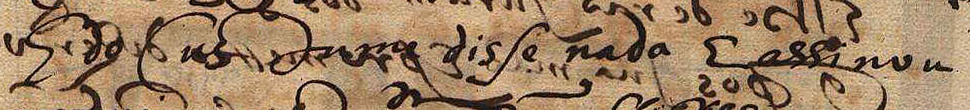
E do Custume disse nada E assinou
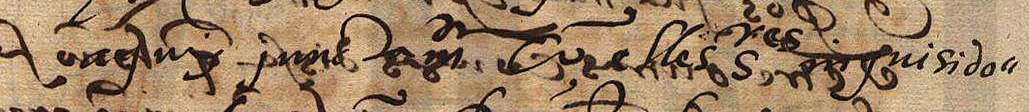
aquy junctamte cō elles sres inquisido
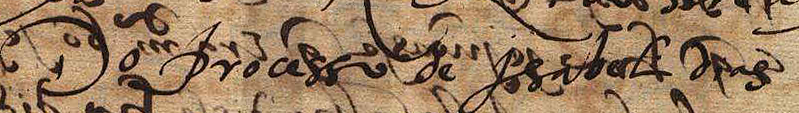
Do processo de jsabeL dias
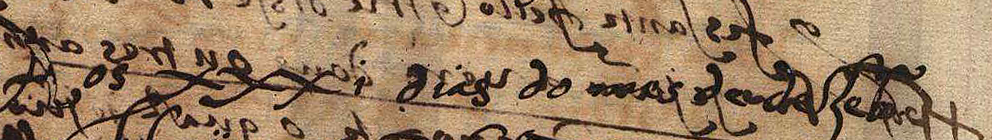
Aos XXXi dias do mes de dezero
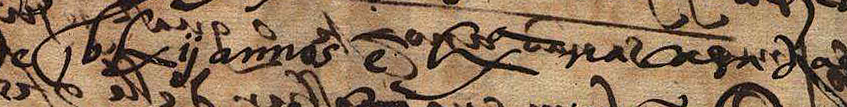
de ibLxij annos ē Lxa na casa das
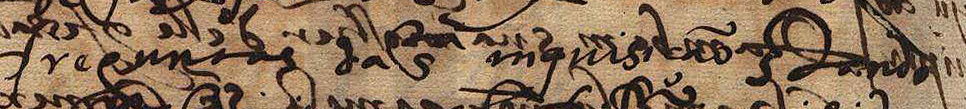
preguntas da sta inquisiçaõ stando
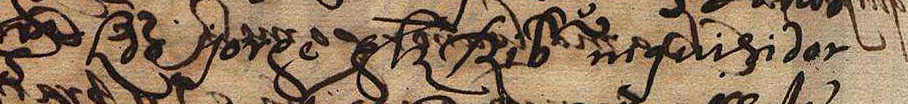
y sr Ldo jorge glz̄ Ribro inquisidor
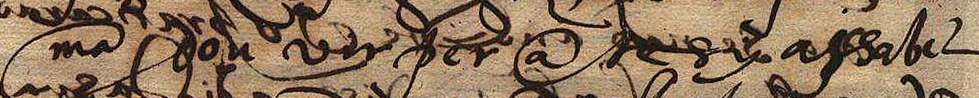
mādou vir perāte sy a jsabeL
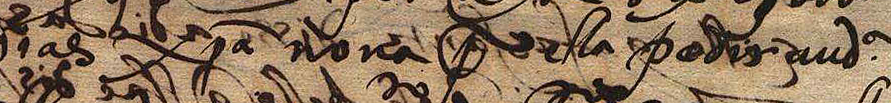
dias Xpā noua p̄o ella pedir aud.a
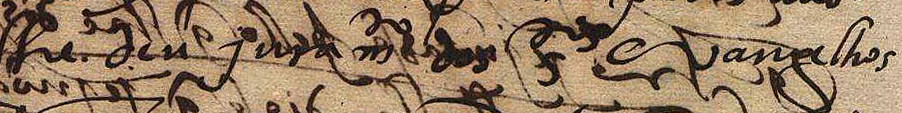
E lhe deu juramto dos Stos evangelhos
